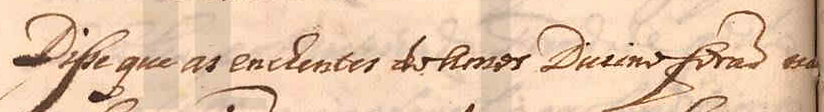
Disse que as enchentes do amor Diuino foraõ na
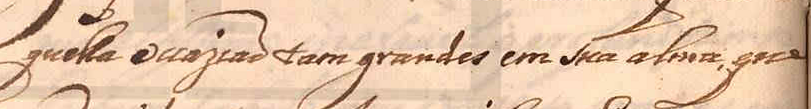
quella occaziaõ tam grandes em sua alma, que
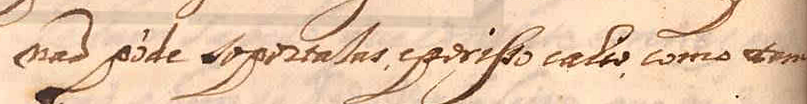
naõ póde soportalas, e por isso cahio, como tem
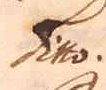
ditto.
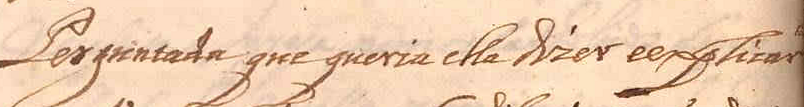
Perguntada que queria ella dizer e explicar
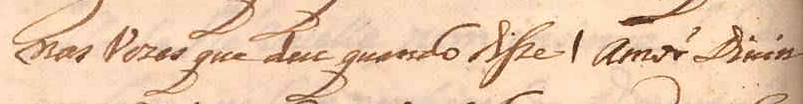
nas Vozes que deu quando disse (amor Diuino
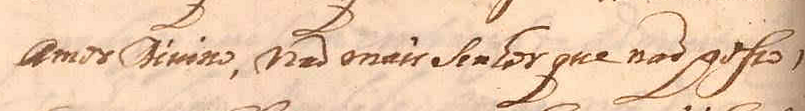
amor Diuino, naõ mais Senhor que naõ posso)
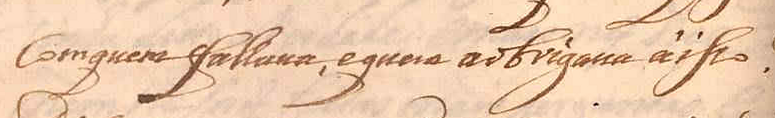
com quem fallaua, e quem a obrigaua a isso?
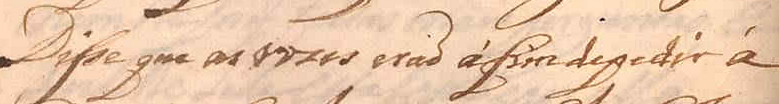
Disse que as vozes eraõ á fim de pedir á
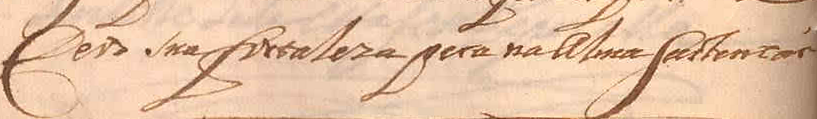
Deos sua fortaleza pera na Alma sustentar
